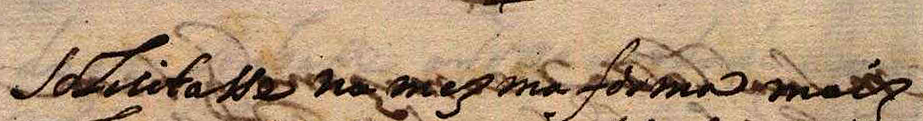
solicitasse na mezma forma maiz
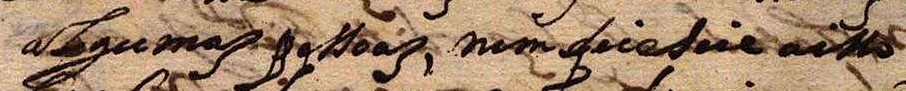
algumaz pessoaz, nem que seia a isso
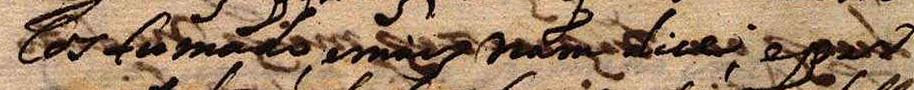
costumado, e maiz nam dice, e per
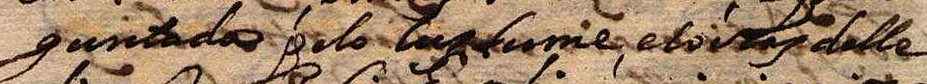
guntada pelo custume, e coizaz delle
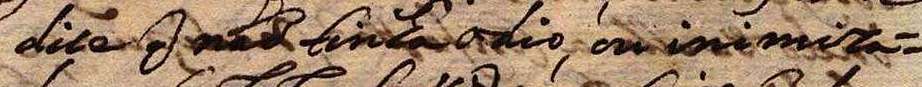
dice q̄ naõ tinha odio, ou inimiza
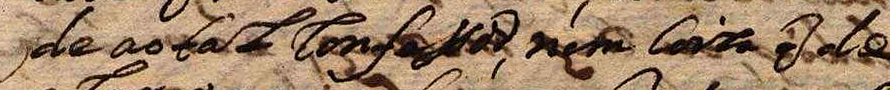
de ao tal Confessor, nem coiza q̄ de
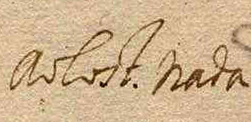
ao Cost. nada
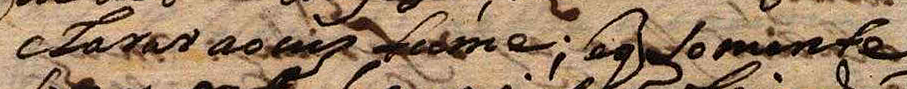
cLarar ao cuztume; e q̄ somente
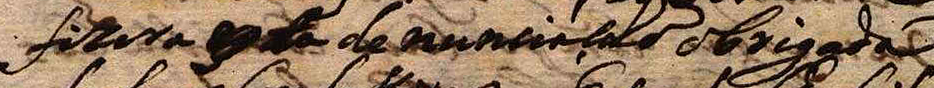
fizera esta denunciaçaõ obrigada
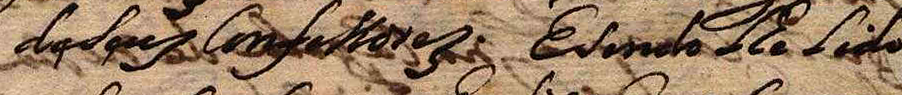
de Seuz Confessorez. E sendo lhe lido
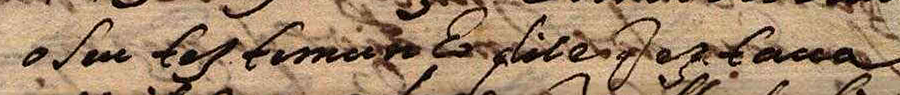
o seu teztemunho E o dice q̄ eztaua
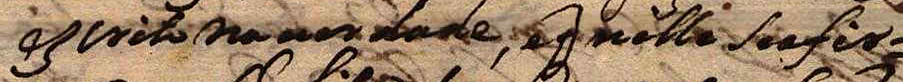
ezcrito na uerdade, e q̄ nelle se afir
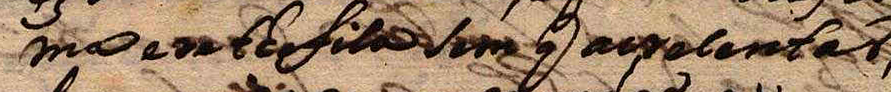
ma e rathefica sem q̄ acrecentar,
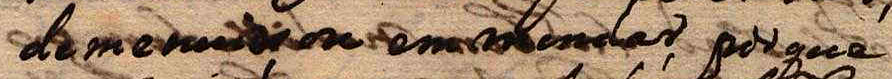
demenuir, ou emmendar, porque
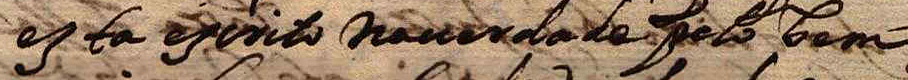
ezta ezcrito na uerdade pelo bem
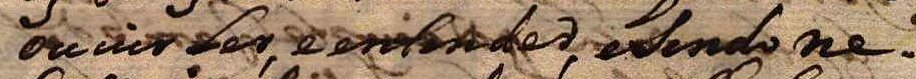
ouuir ler, e entender, e sendo ne
